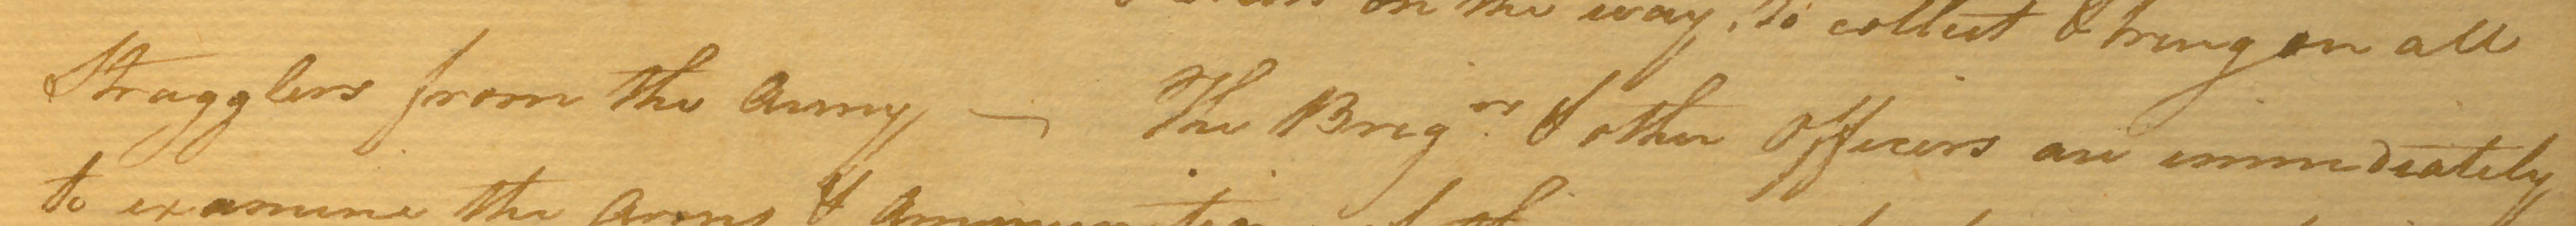Stragglers from the Army- The Brig^rs. & other Officers are immediately
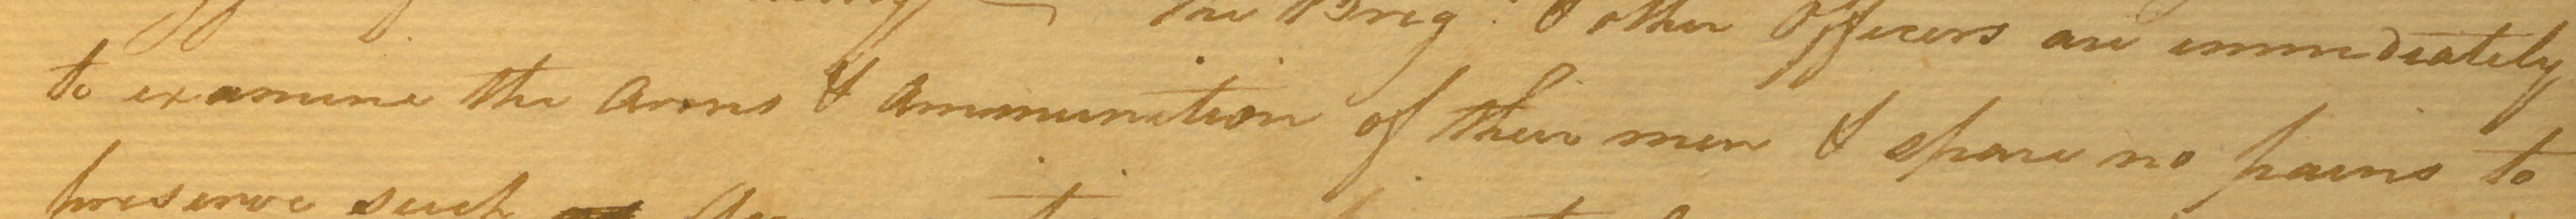to examine the Arms & Ammunition of their men & spare no pains to
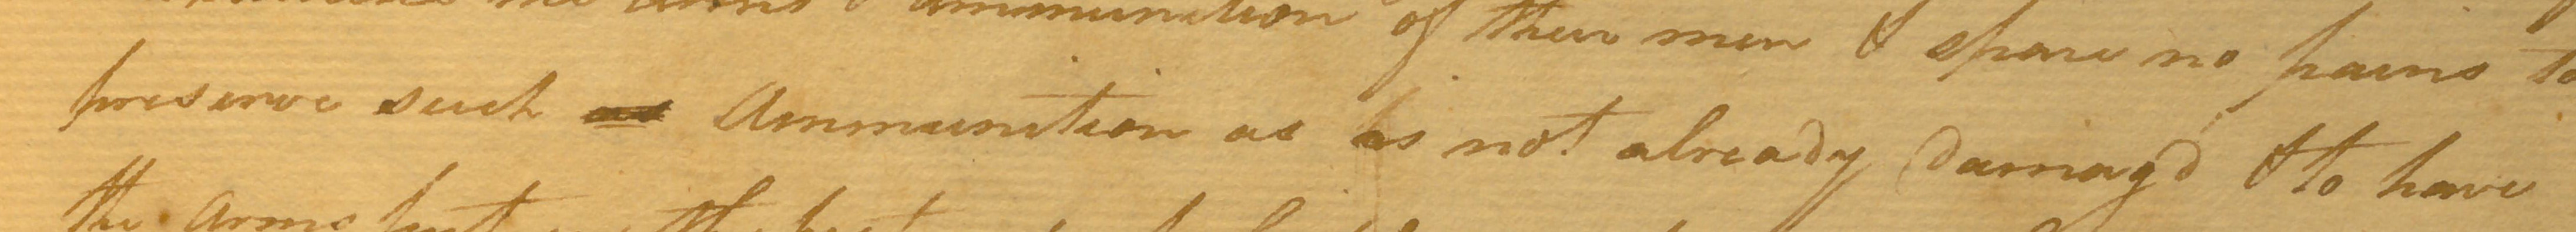preserve such Ammunition as is not already damag'd & to have
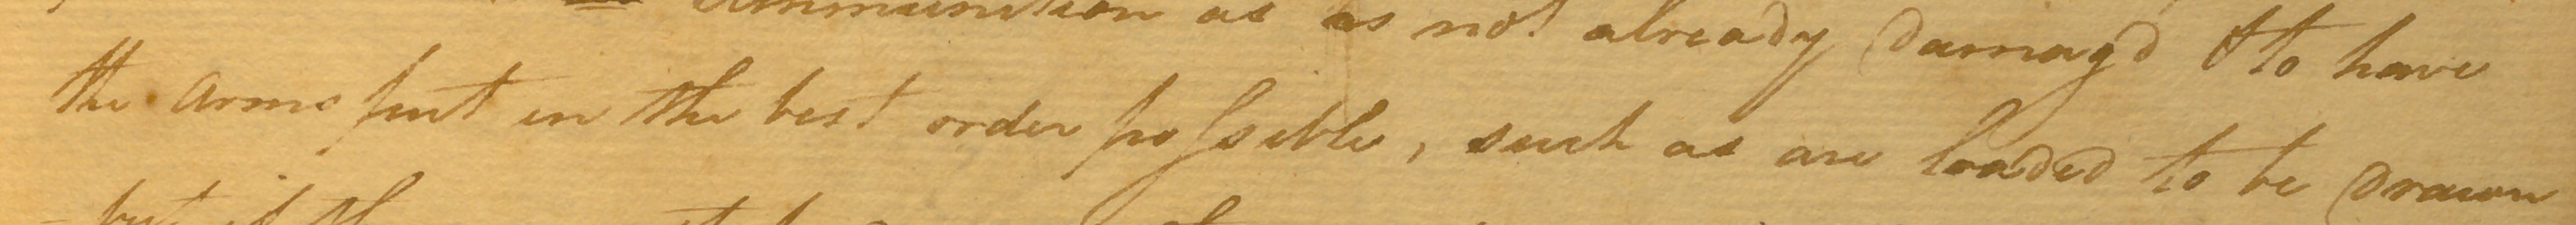the Arms sent in the last order possible, such as are loaded to be drawn
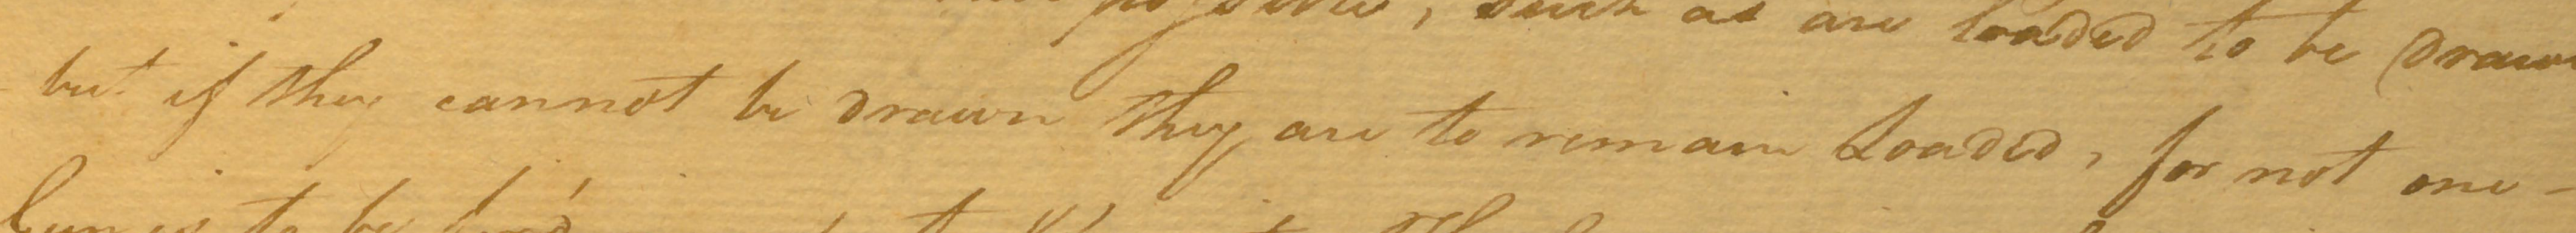but if they cannot be drawn they are to remain Loaded, for not one-
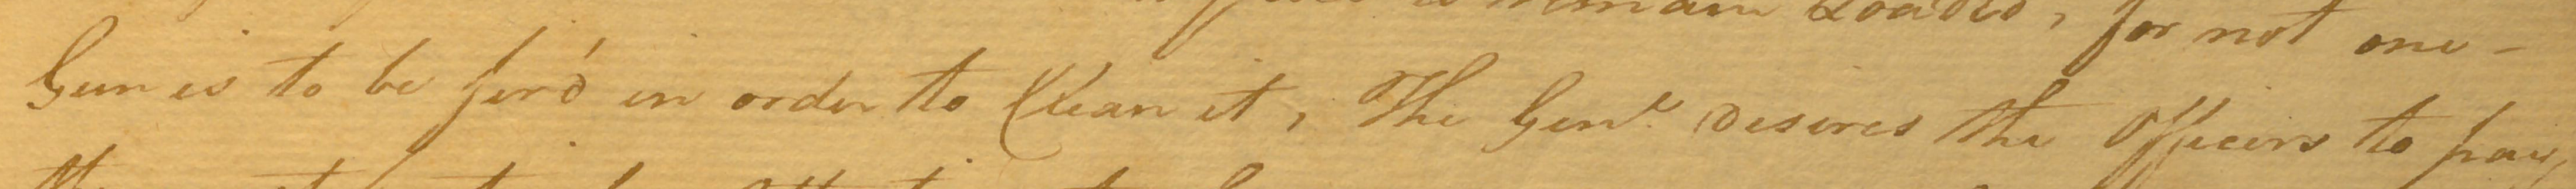Gun is to be fir'd in order to Clean it. The Gen^l. desires the Officers to pay
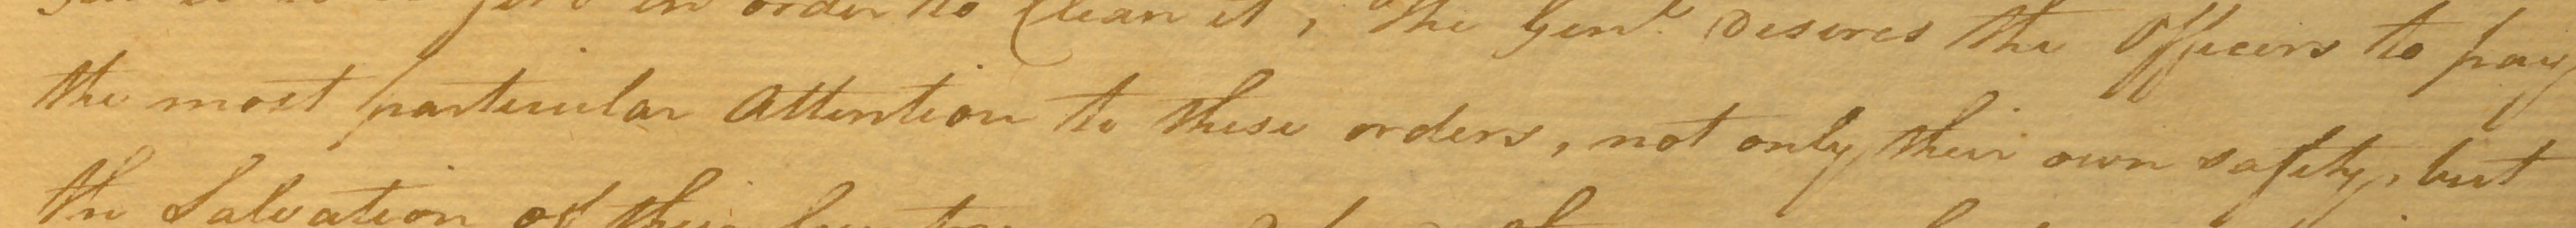the most particular attention to these orders, not only their own safety, but
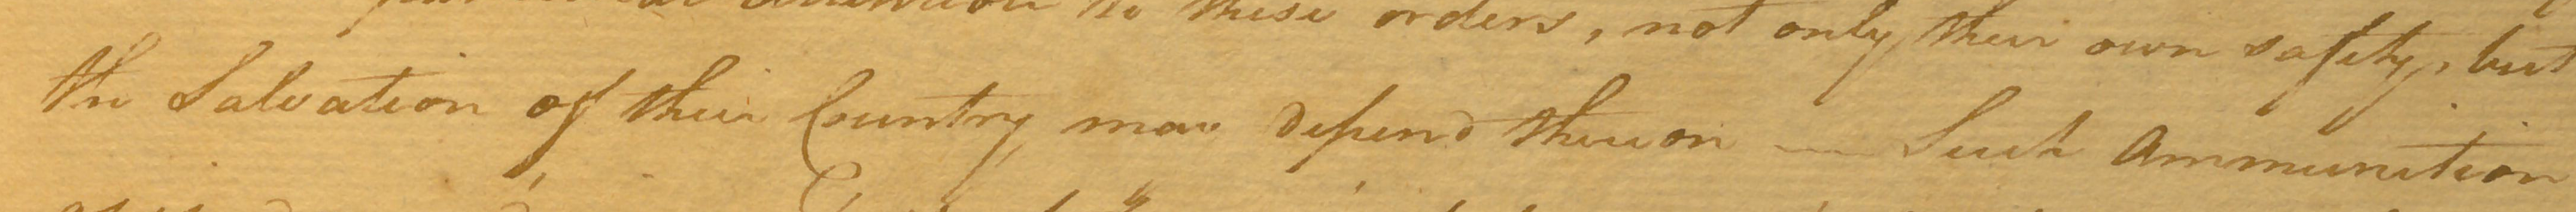the Salvation of their Country men depend thereon- Such Ammunition
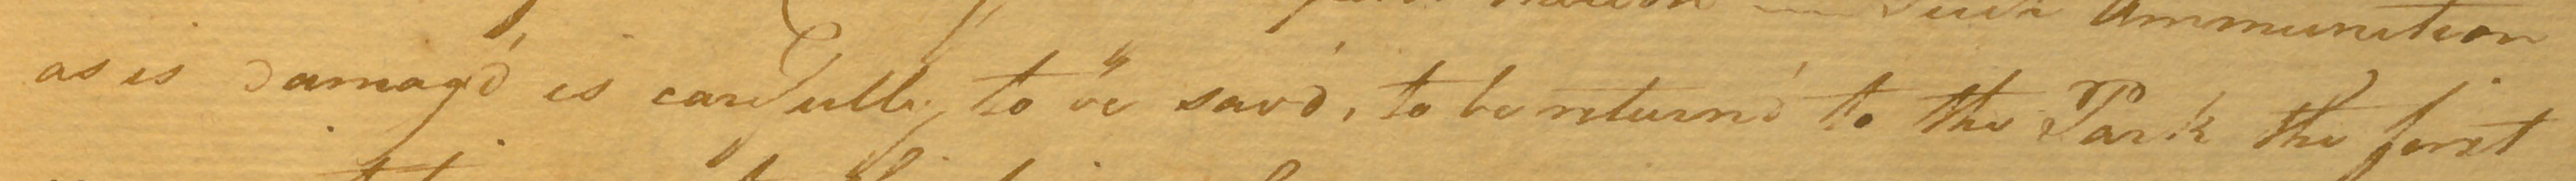as is damag'd is carefully to be sav'd, to be return'd to the Park the first
